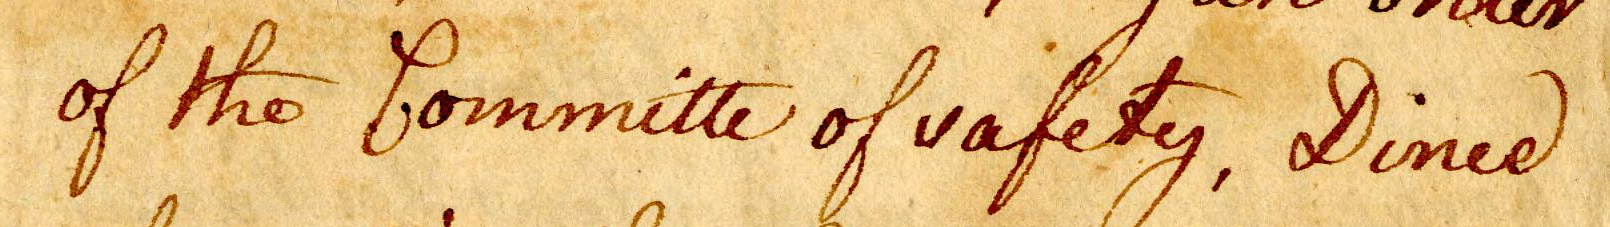of the Committe of safety, Dined
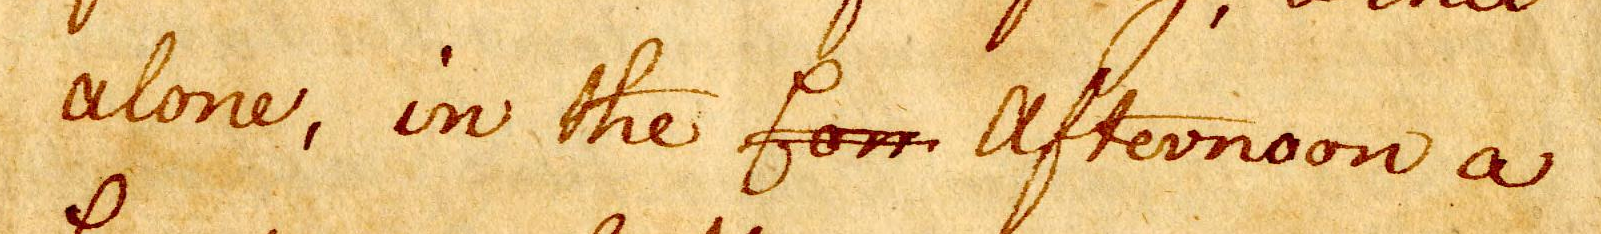alone, in the [Con] Afternoon a
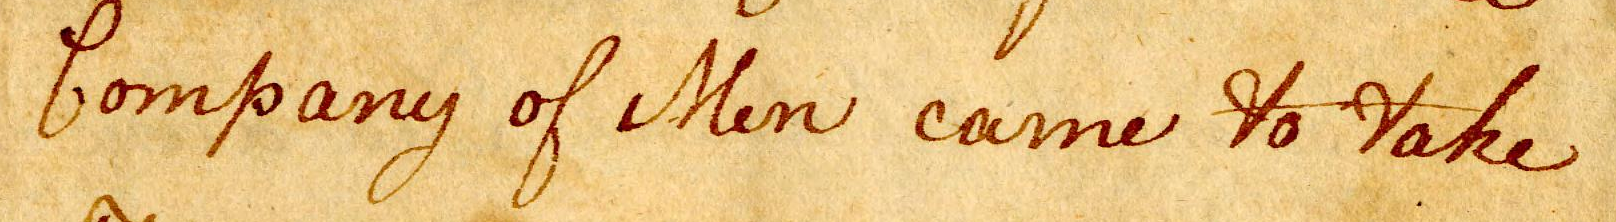Company of Men came to take
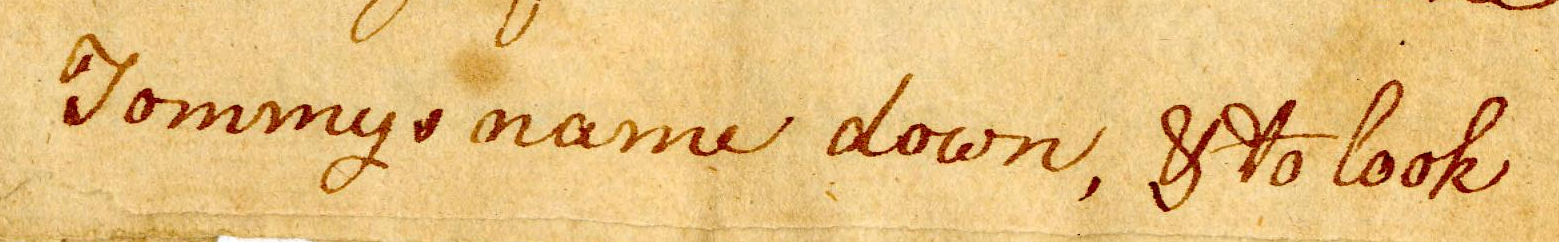Tommys name down, & to look
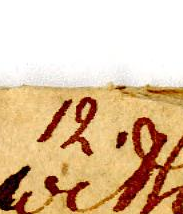12
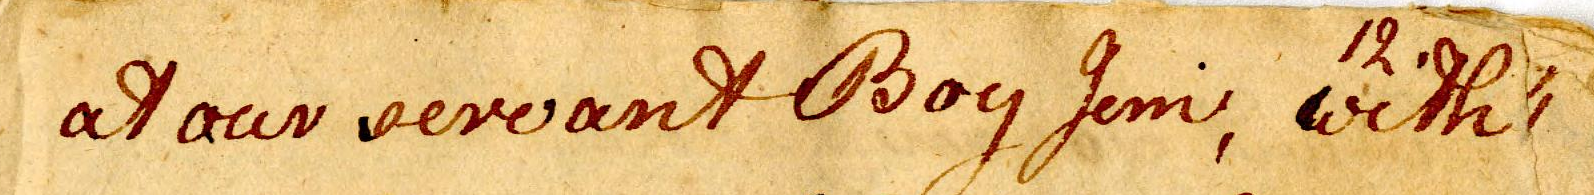at our servant Boy Jem, with
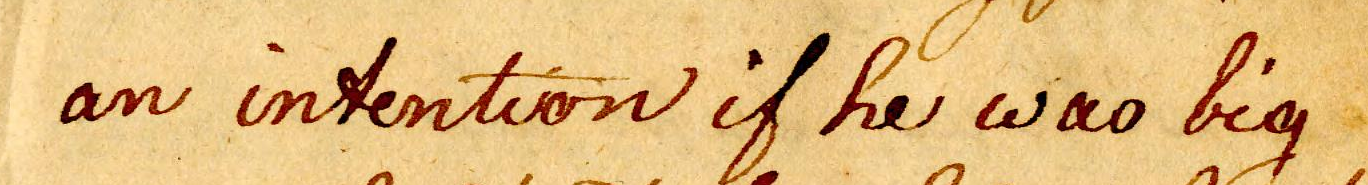an intention if he was big
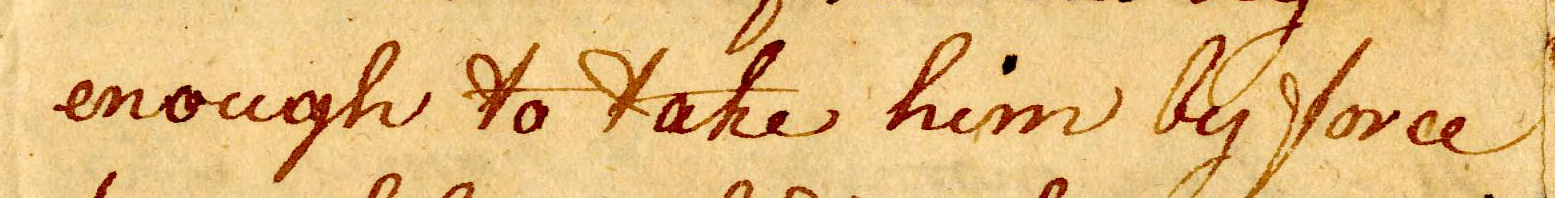enough to take him by force
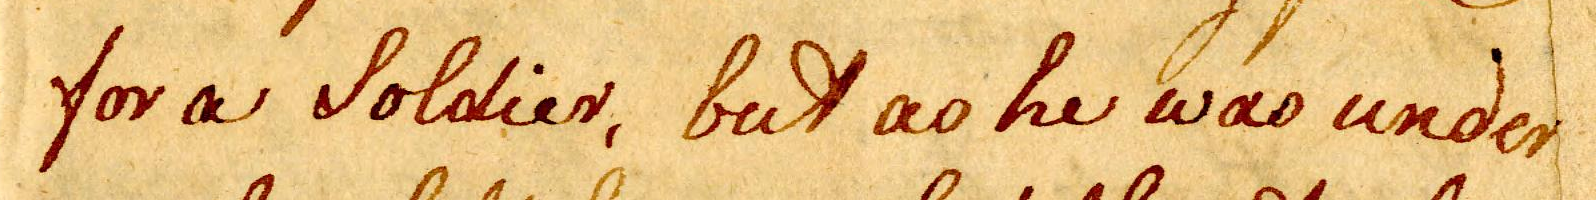for a Soldier, but as he was under
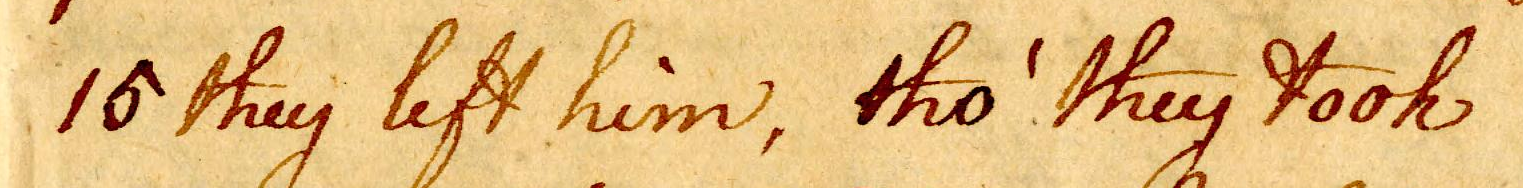15 they left him, tho' they took
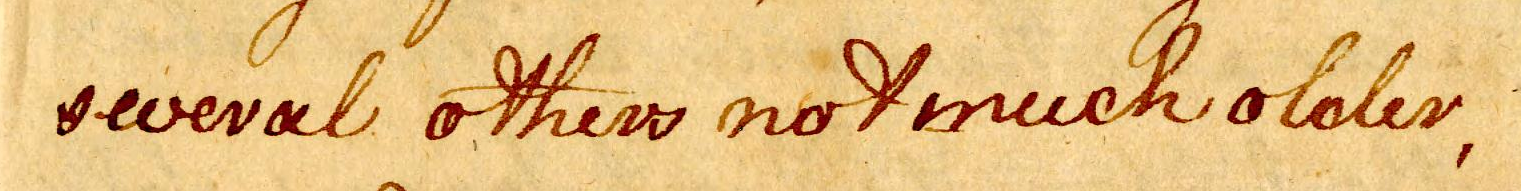several others not much older,
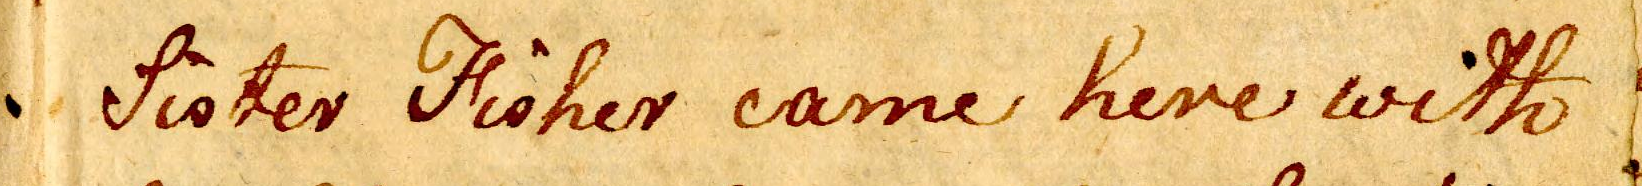Sister Fisher came here with
